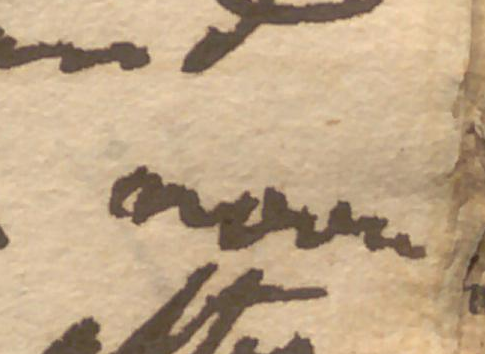nown
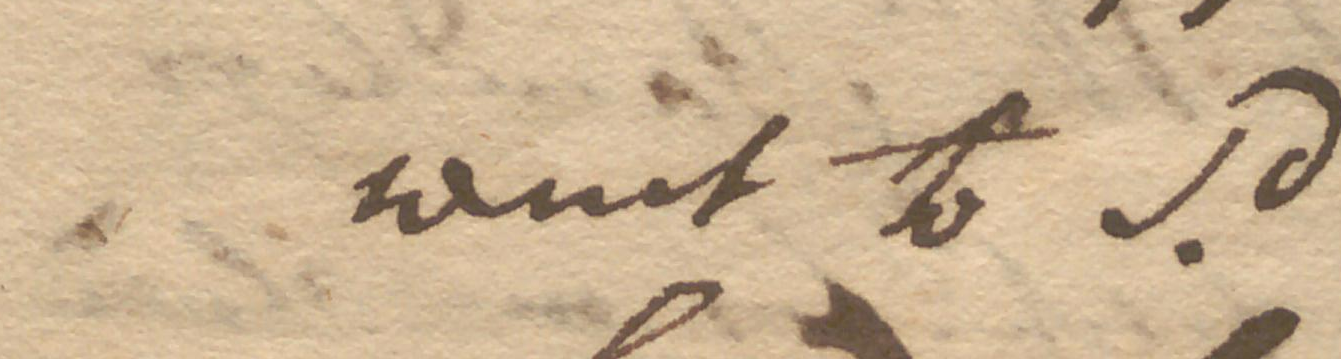went to S^.
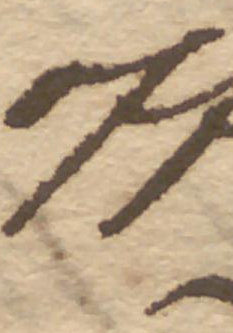1
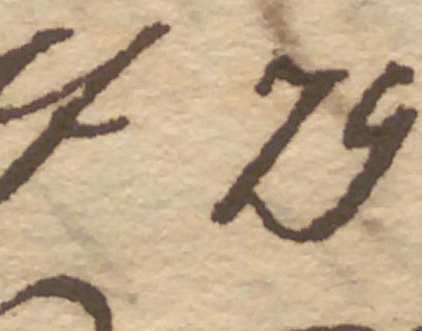4
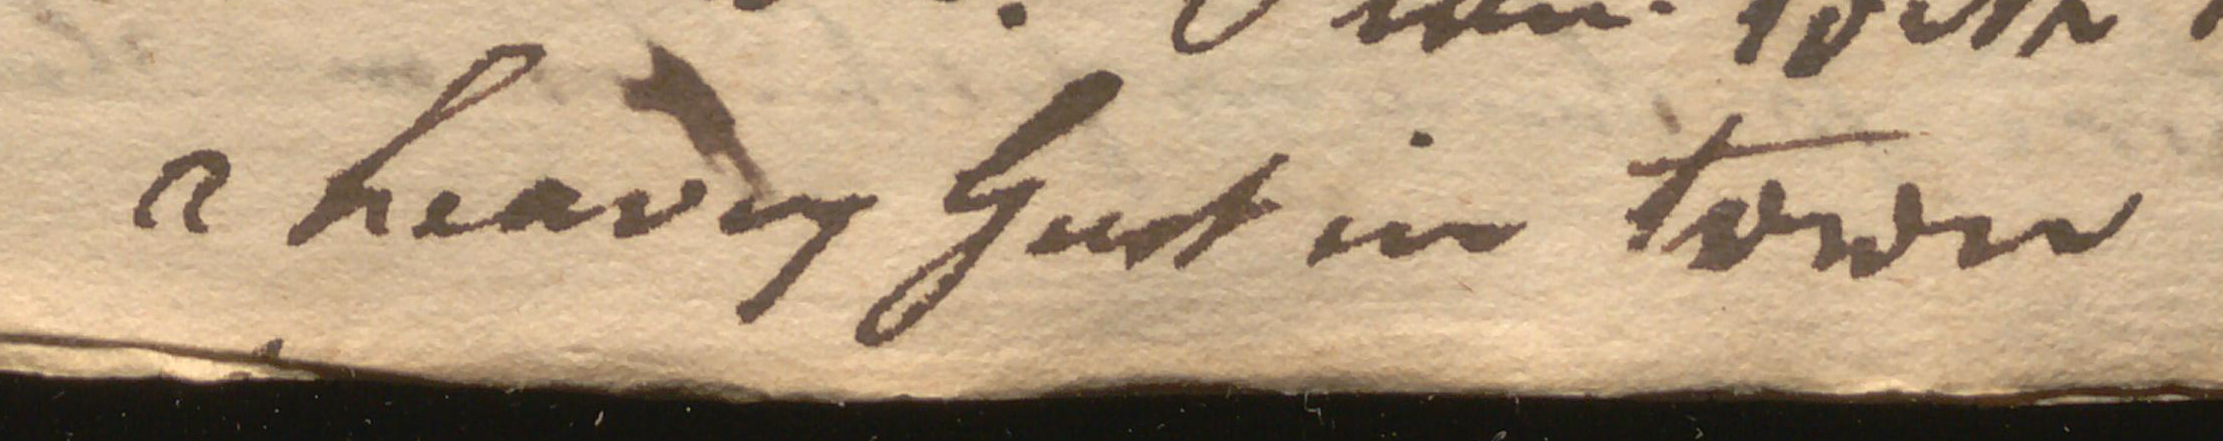A hear 77 Just ine Towne
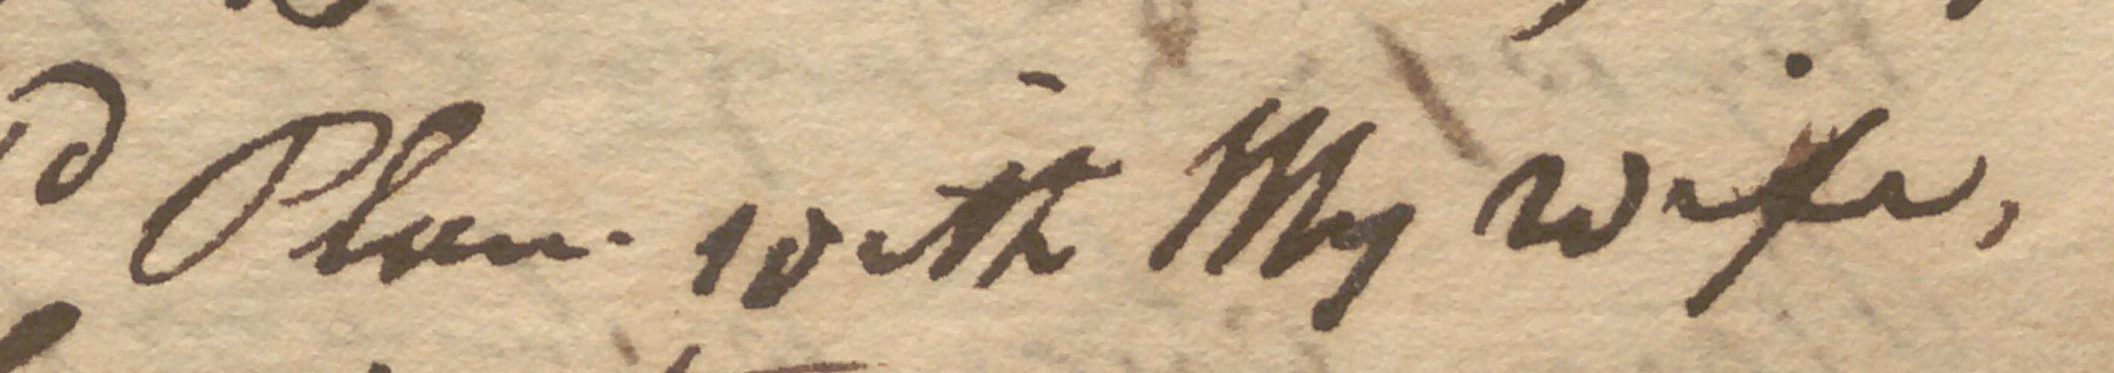Plen with My wife,
